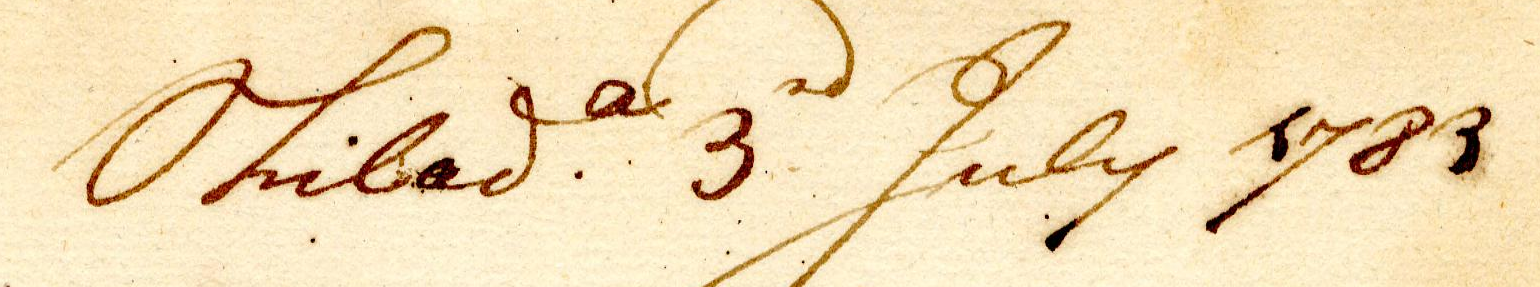Philad^a. 3^rd July 1783
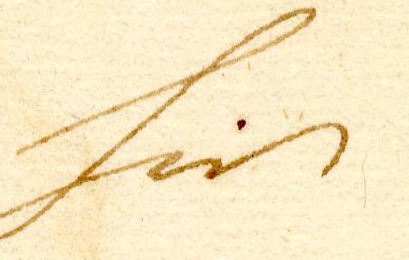Sir
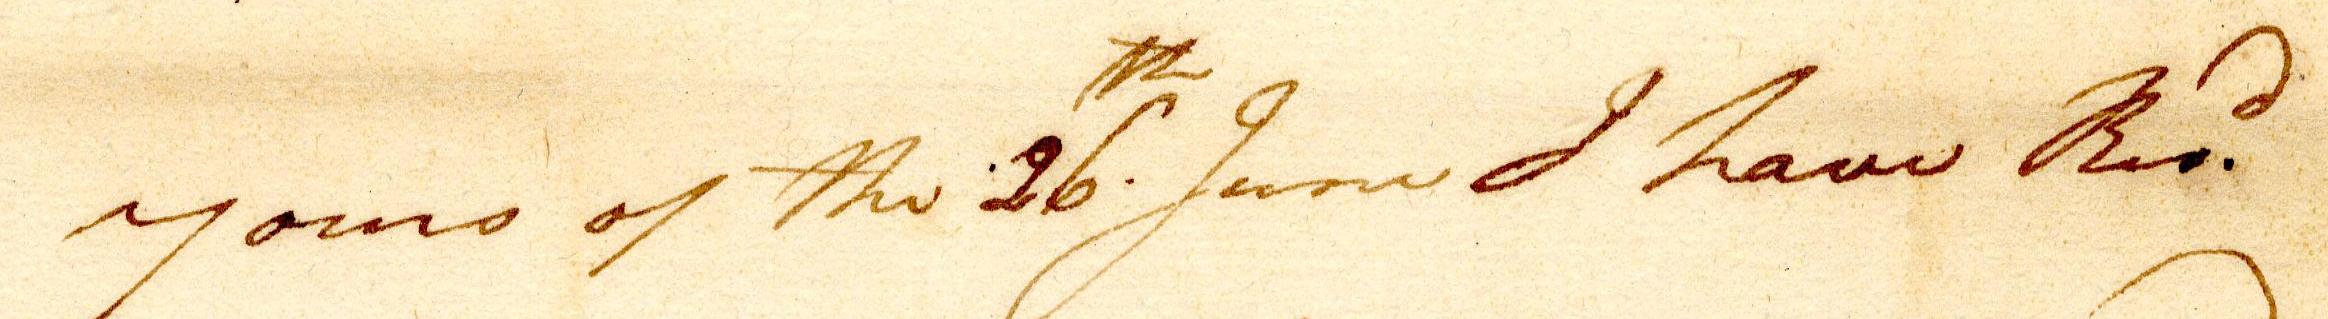yours of the 26^th June I have Rec^d.
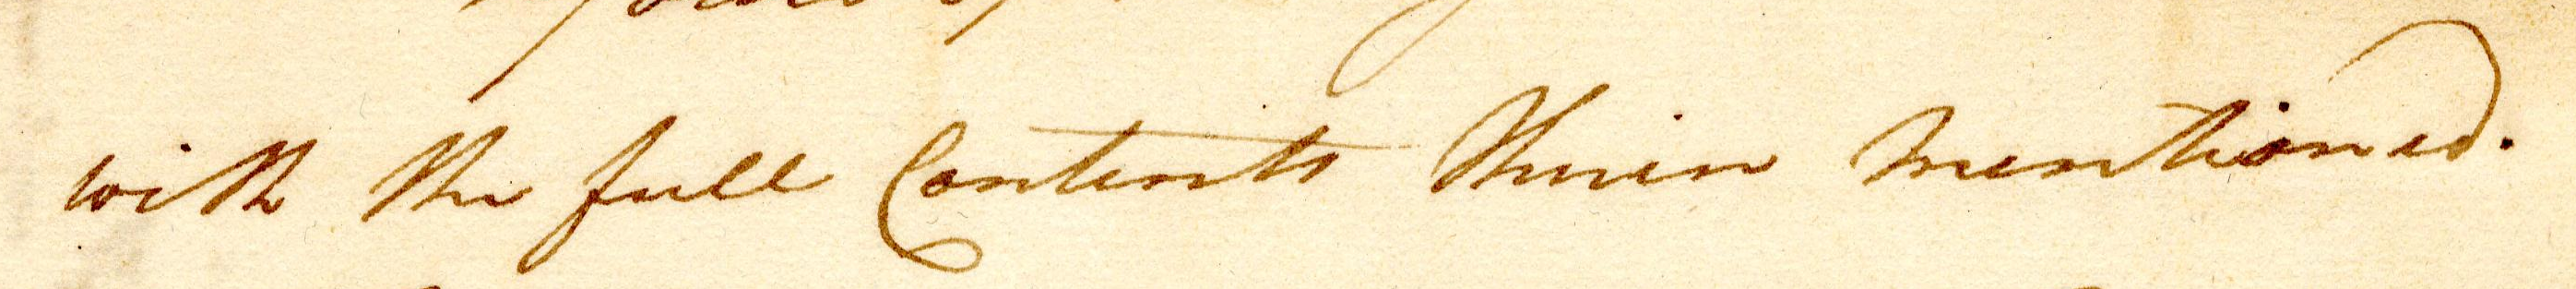with the full Contents therein mentioned.
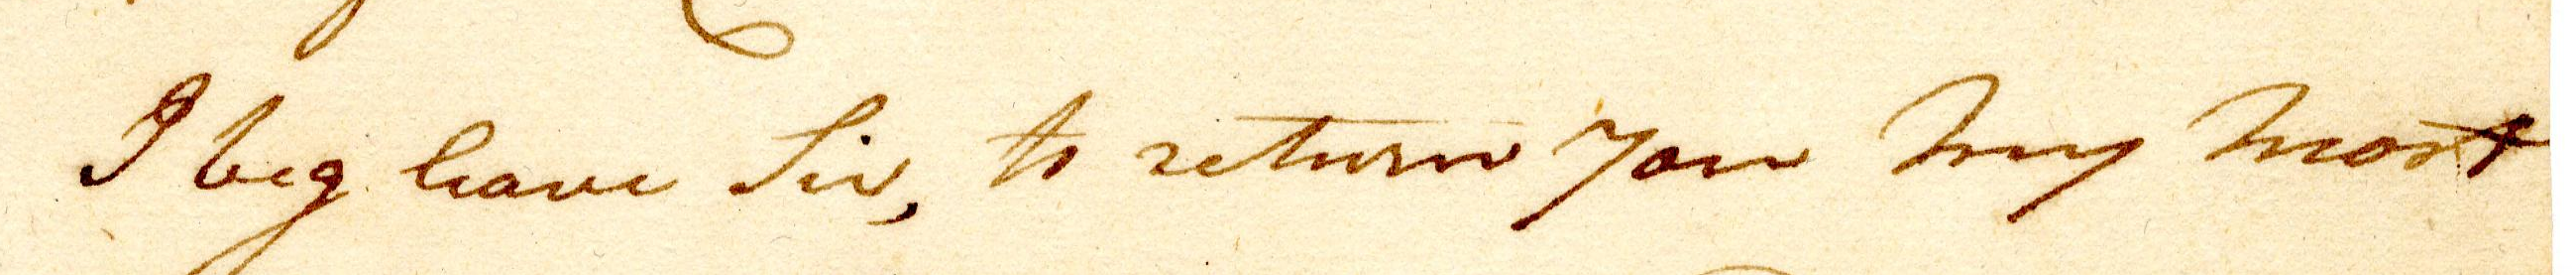I beg leave Sir, to return you my most
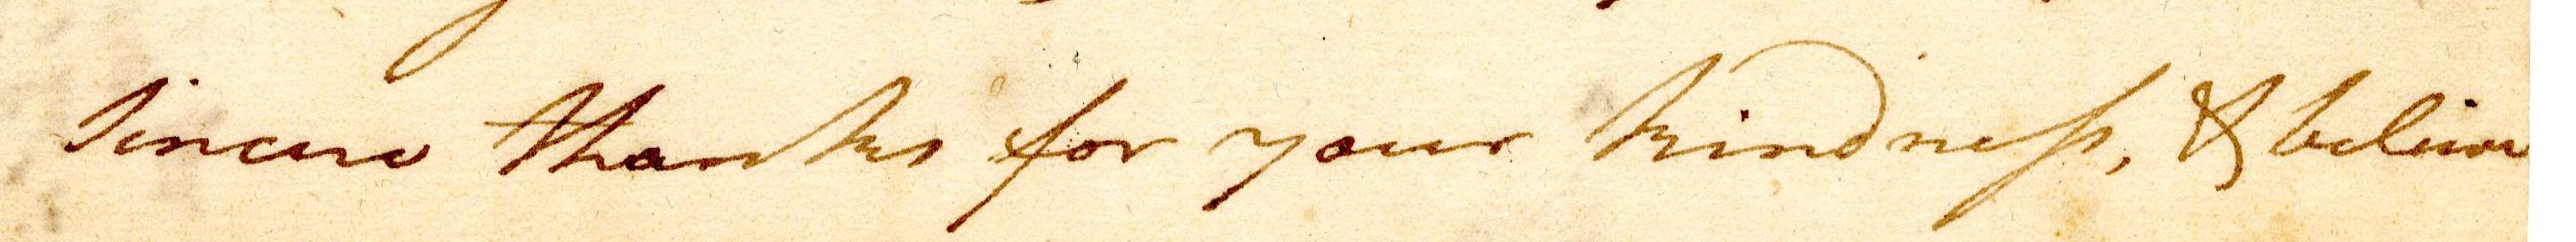Sincere thanks for your kindness, & believe
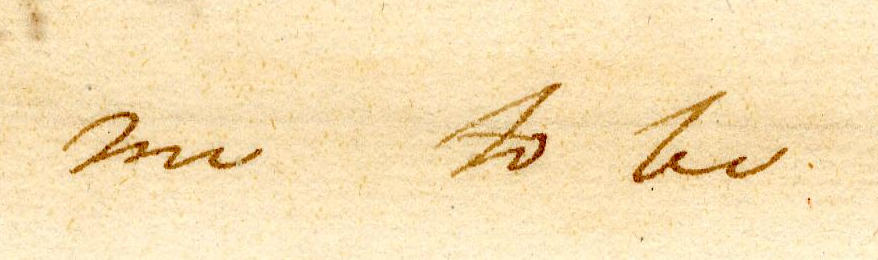me to be
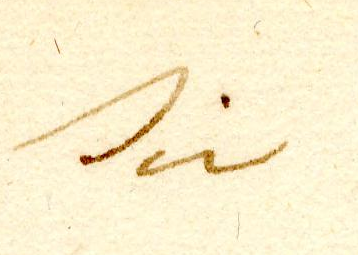Sir
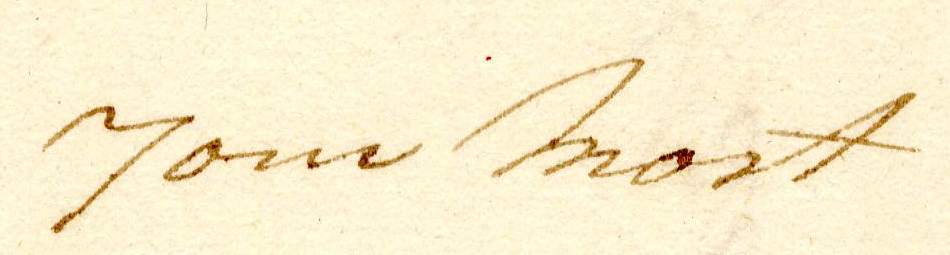Your most
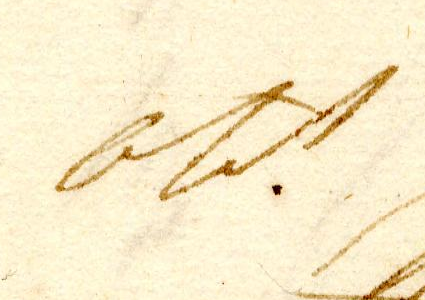Ob^t
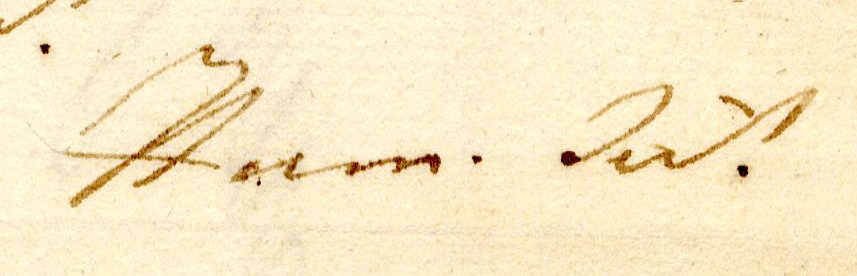Hum. Ser^t.
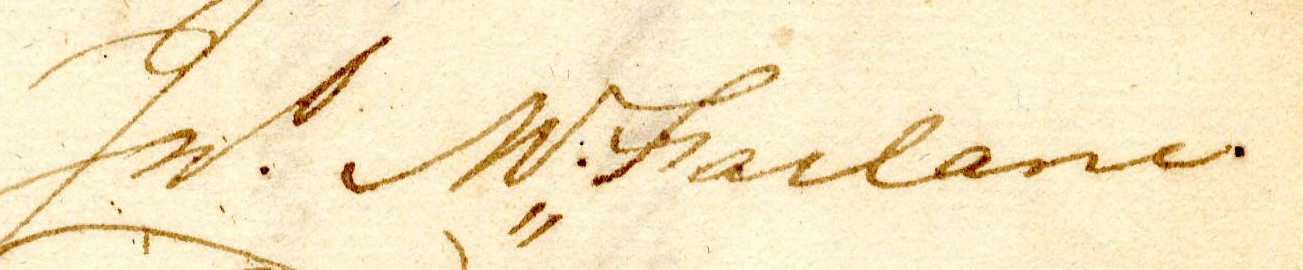Jn^o. M^cFarlane
